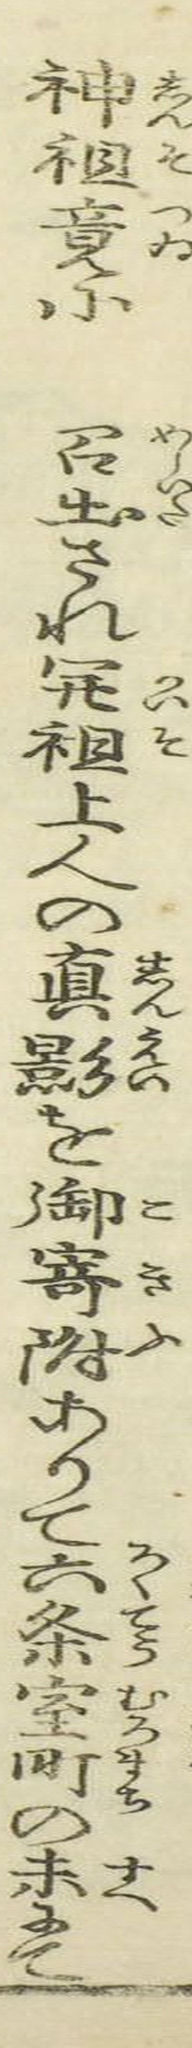神祖竟に召出され開祖上人の真影を御寄附ありて六条室町の末にて
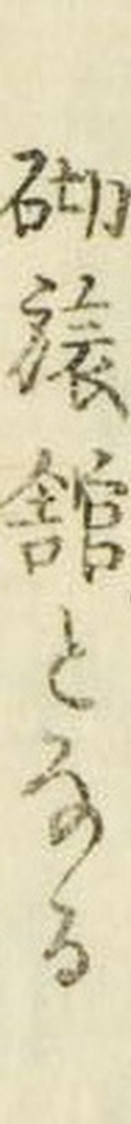砌旅館となる
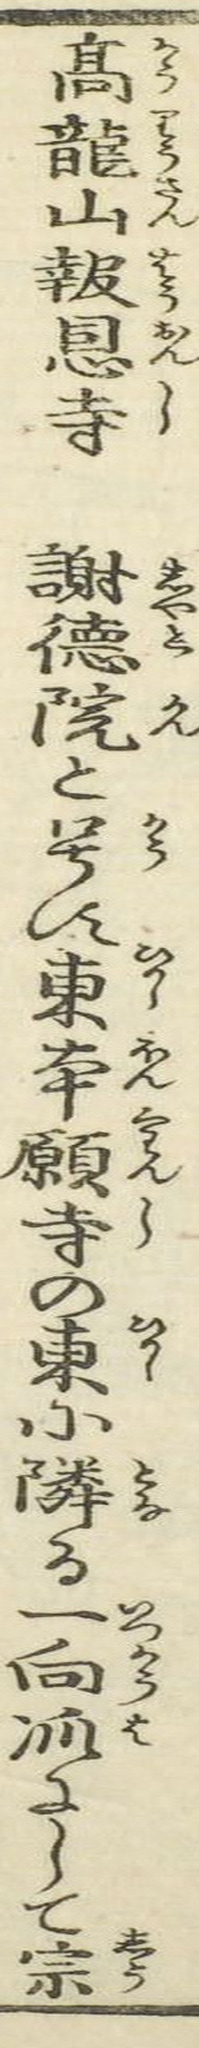高龍山報恩寺謝徳院と号す東本願寺の東に隣る一向派にして宗
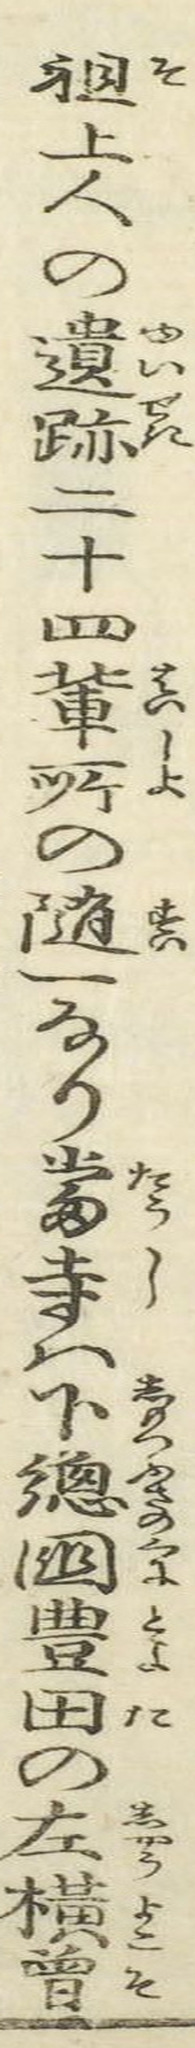祖上人の遺跡二十四輩所の随一なり当寺は下総国豊田の左横曾
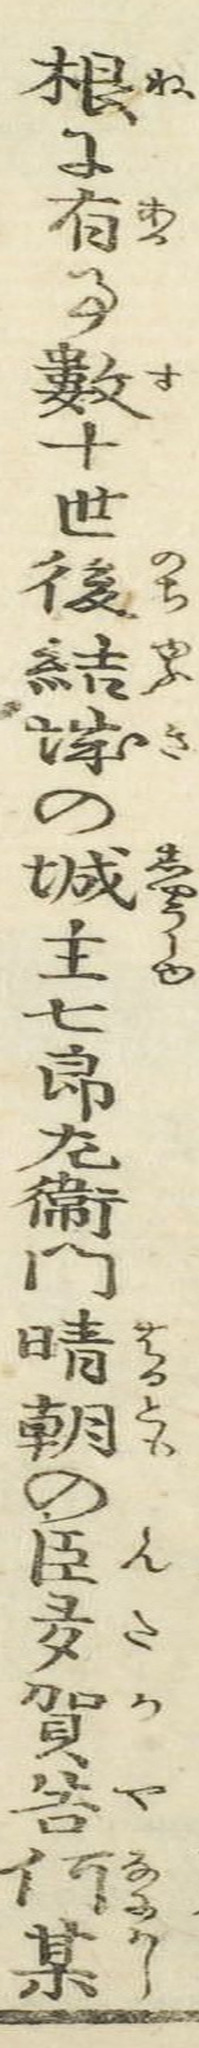根に有事数十世後結城の城主七郎左衛門晴朝の臣多賀谷何某
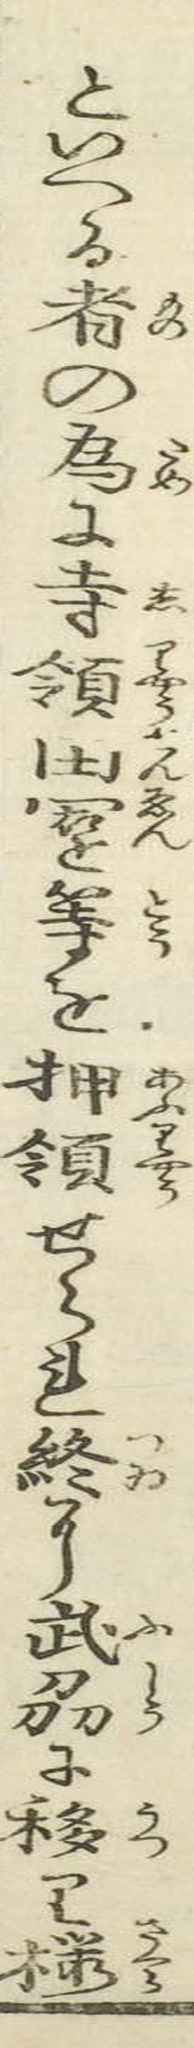といへる者の為に寺領田園等を押領せられ終に武州に移り桜
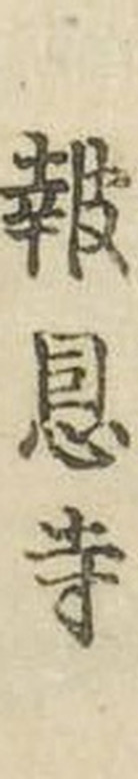報恩寺

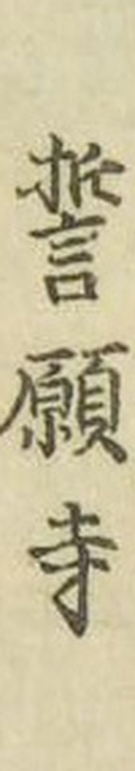誓願寺

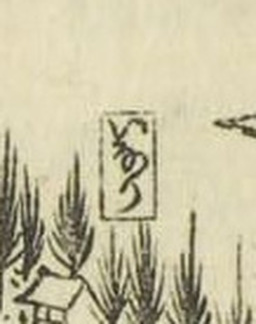いなり
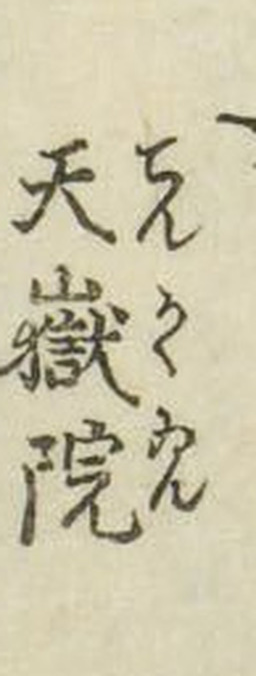天嶽院
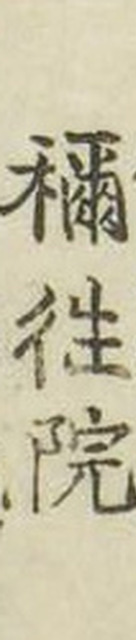称往院
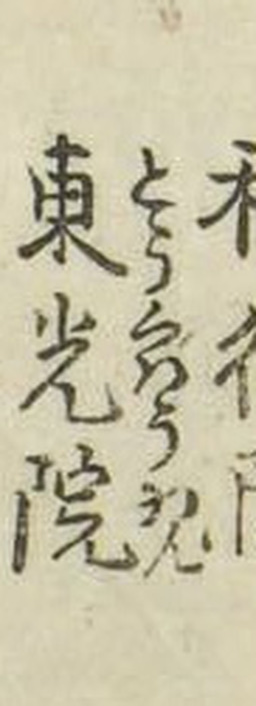東光院
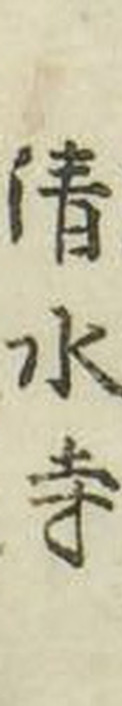清水寺
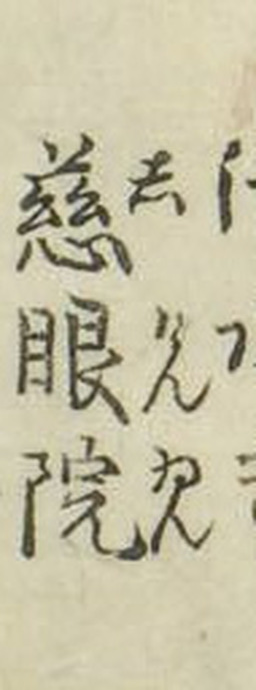慈眼院
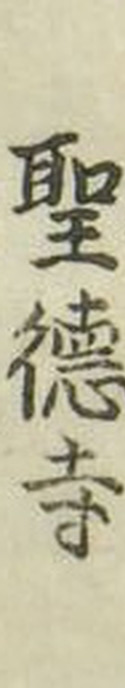聖徳寺
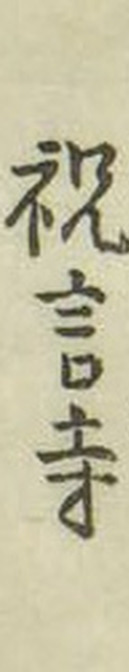祝言寺
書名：江戸名所図会 20巻 巻之16
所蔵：東京学芸大学教育コンテンツアーカイブ
